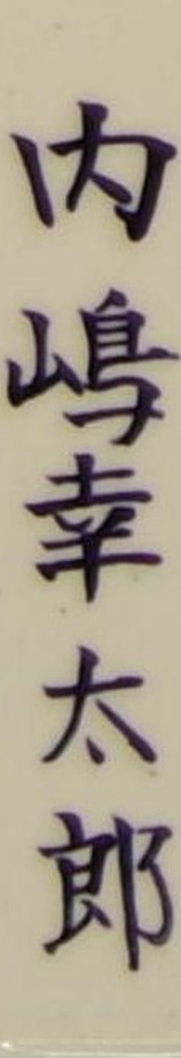内嶋幸太郎
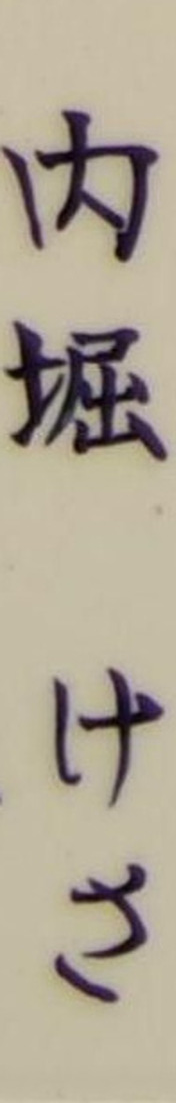内堀けさ
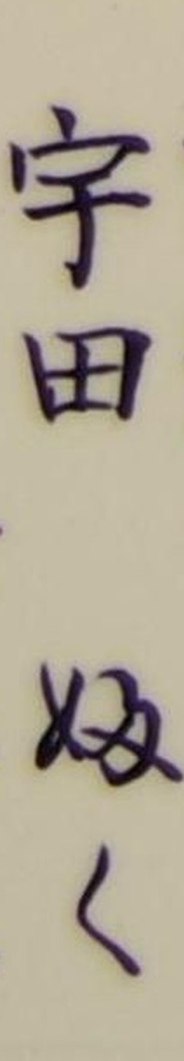宇田ふく
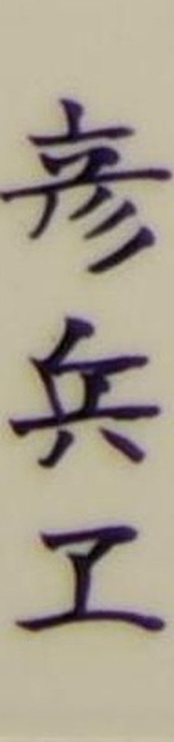彦兵ヱ
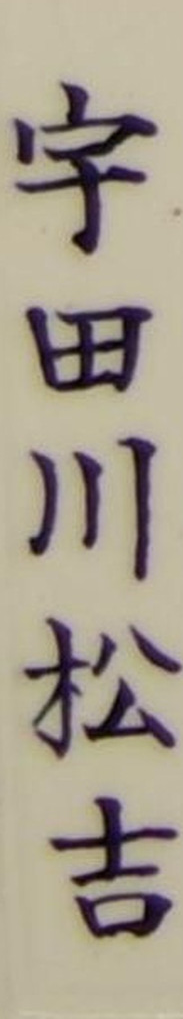宇田川松吉

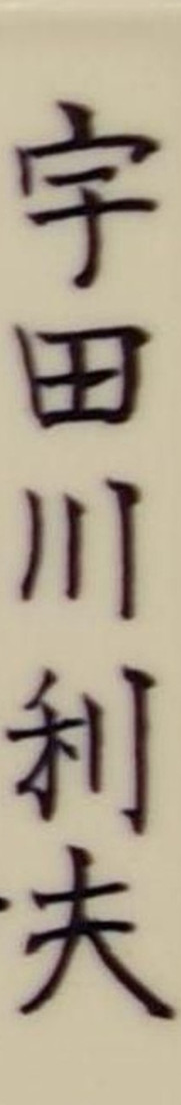宇田川利夫
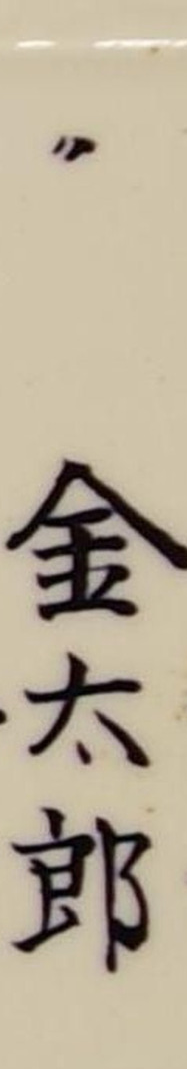金太郎
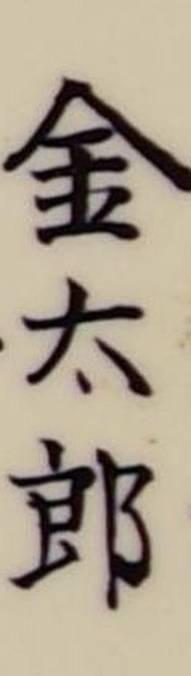金太郎
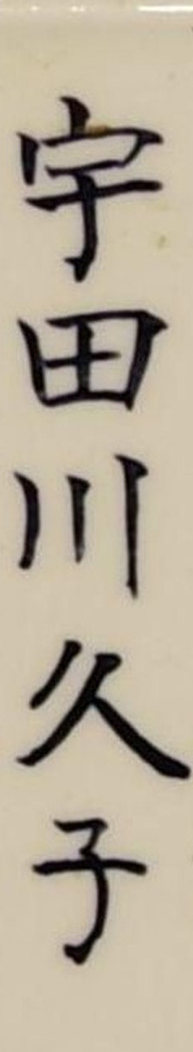宇田川久子
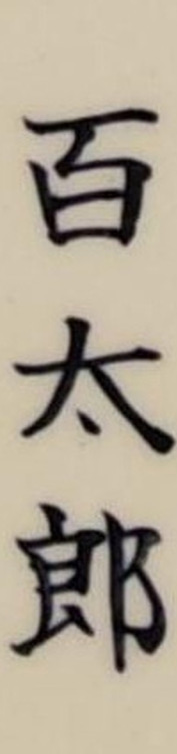百太郎
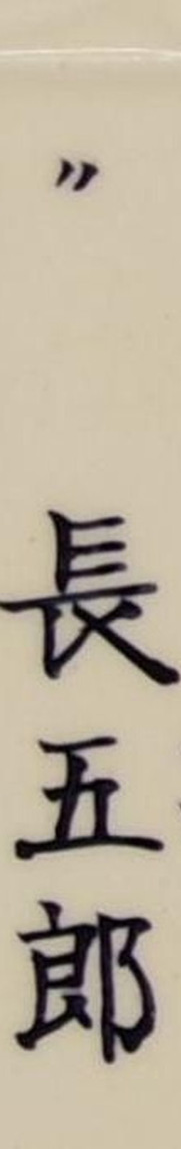長五郎
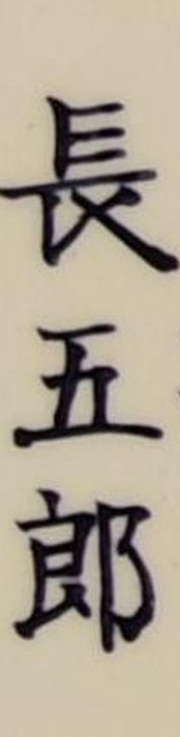長五郎
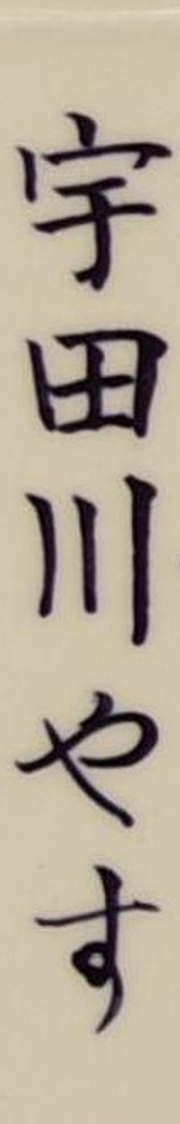宇田川やす
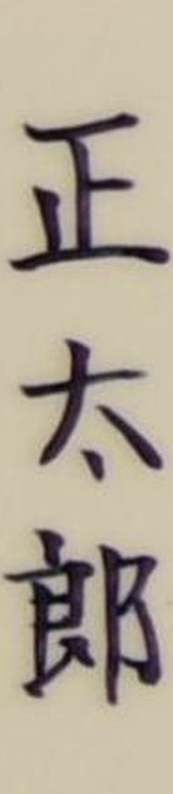正太郎

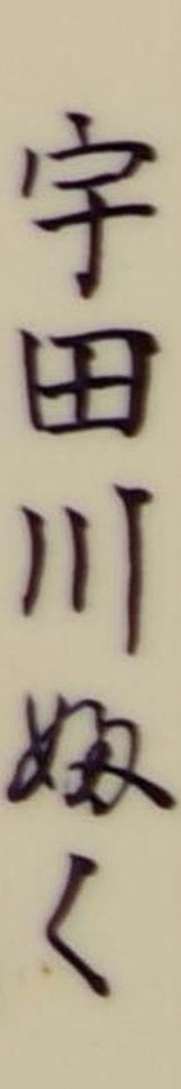宇田川ふく
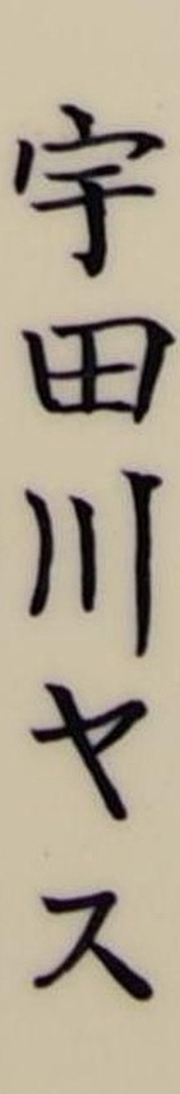宇田川ヤス
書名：A~D
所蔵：koyasan kongobuji
